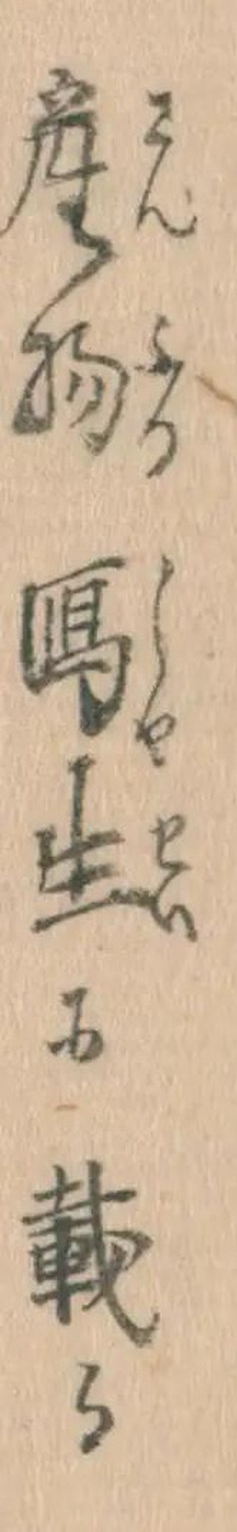産物写生に載る
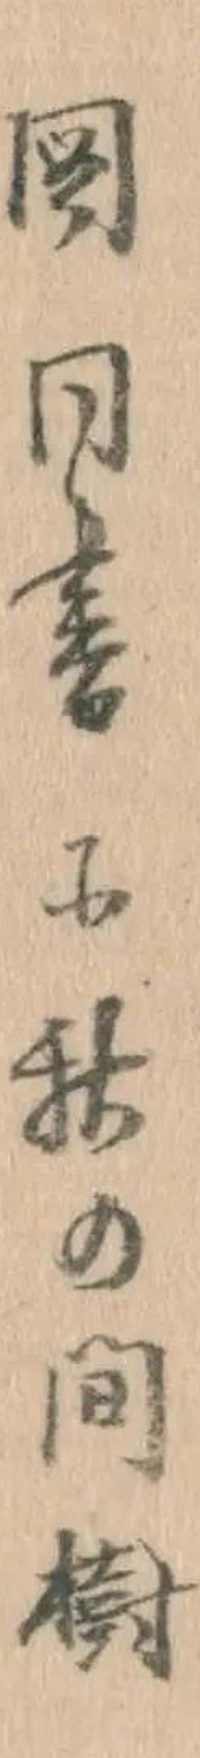図同書に秋の間樹
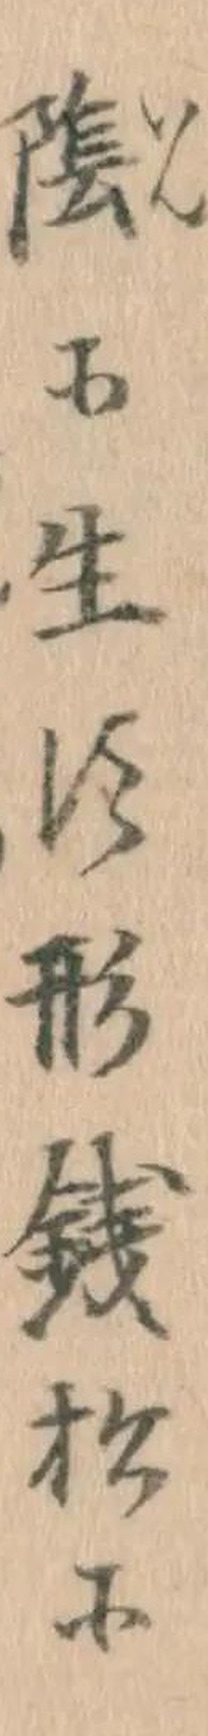陰に生す形銭松に
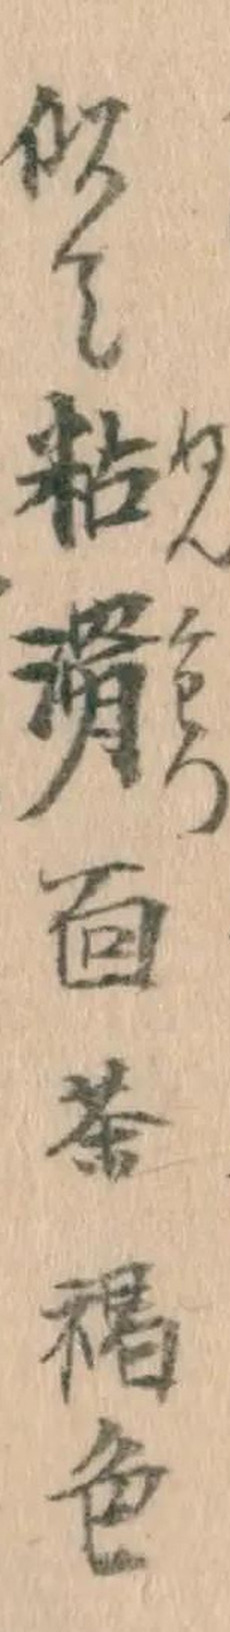似て粘滑面茶褐色
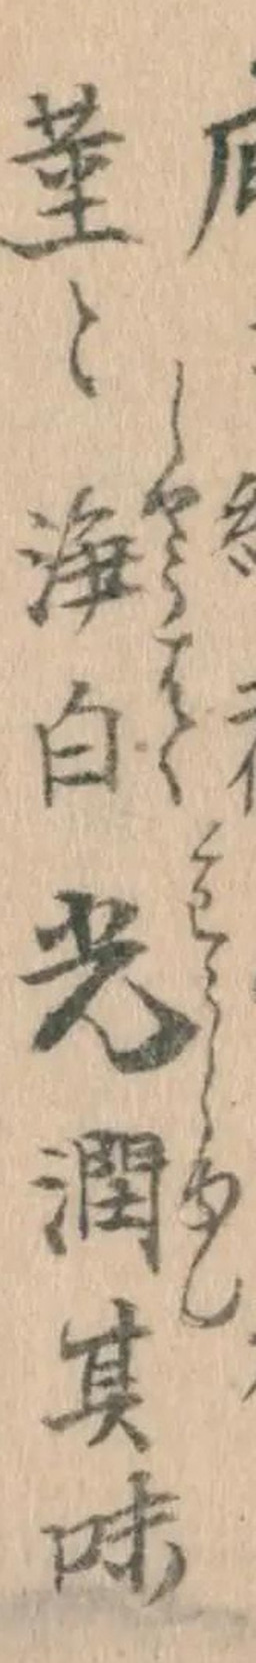茎と浄白光潤其味
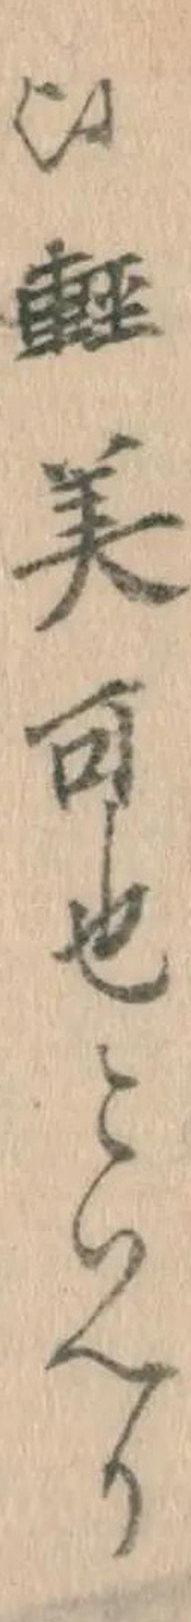ひ軽美可也といへり

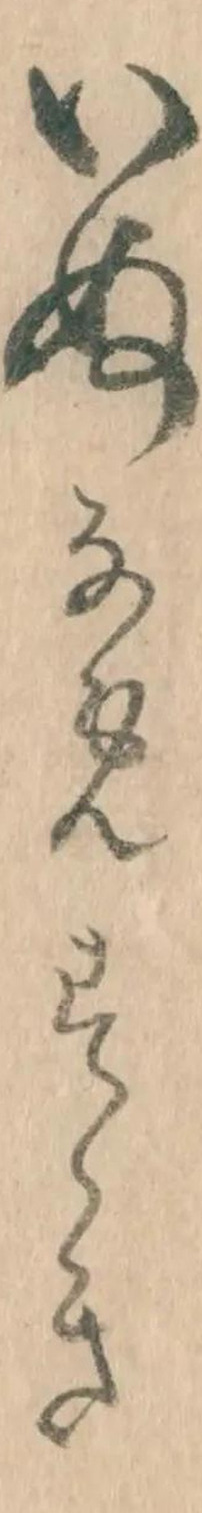いぬなめすゝき
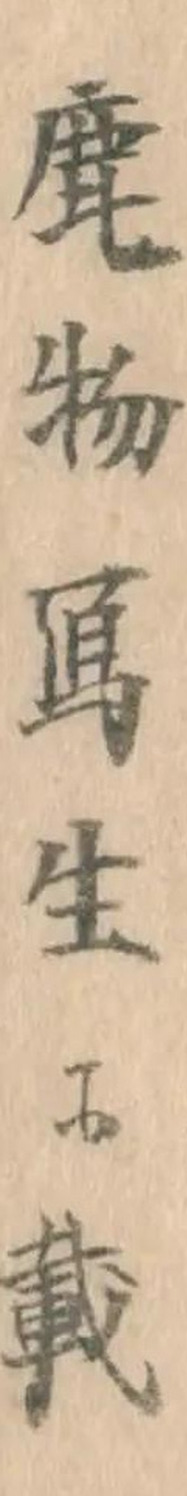鹿物写生に載
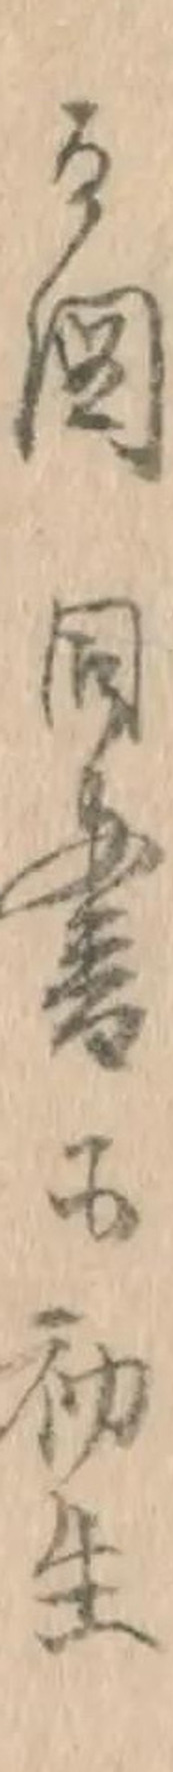る図同書に初生
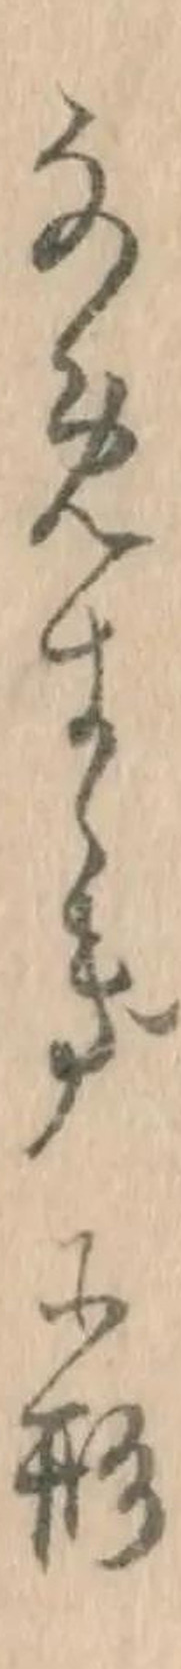なめすゝきに形
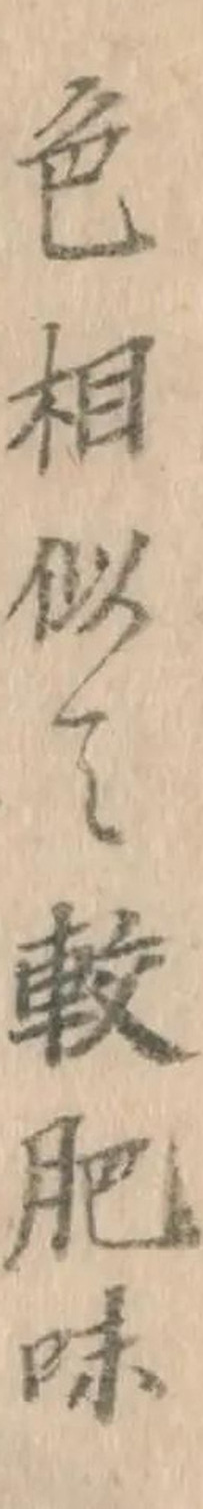色相似て較肥味
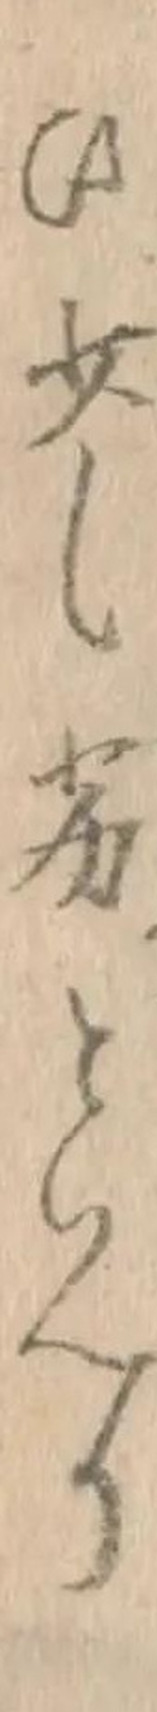ひ少し劣といへり
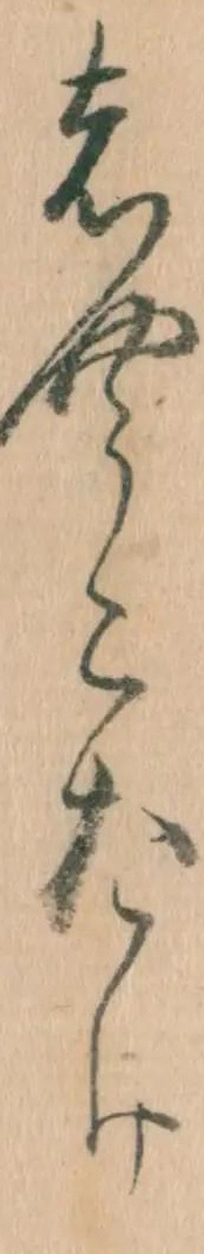しやうこたけ
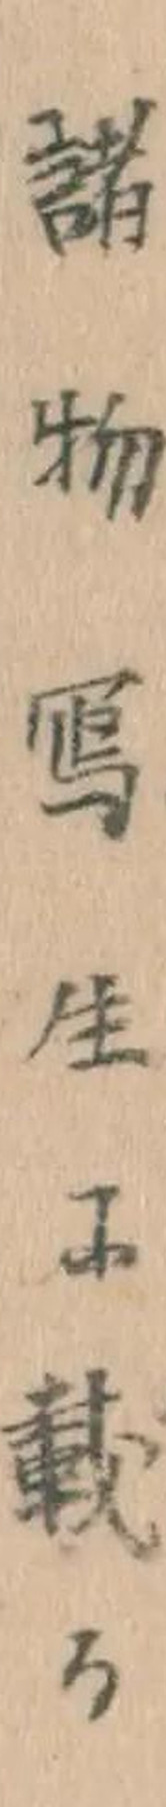諸物写生に載る
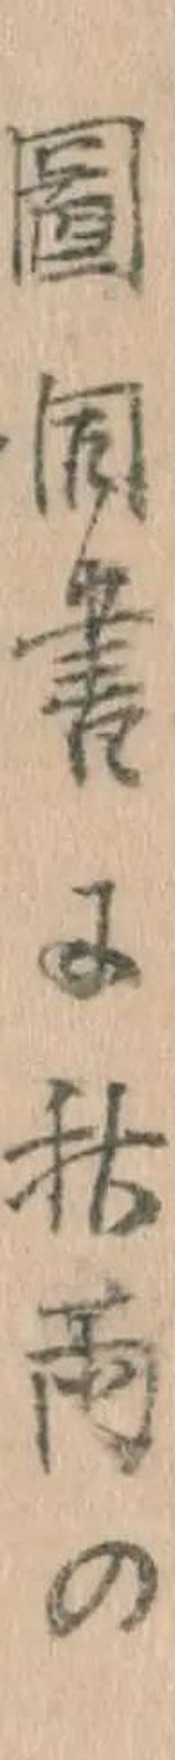図同書に秋雨の
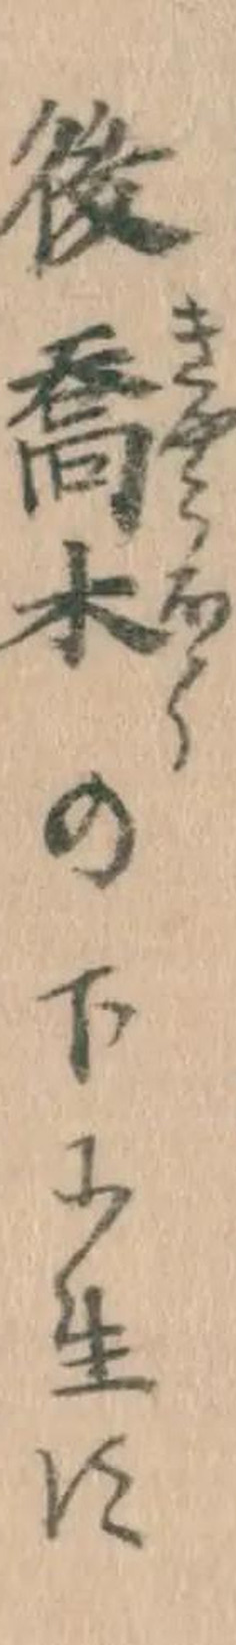後喬木の下に生す
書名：本草図譜. 巻58-60
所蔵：国立国会図書館 National Diet Library, JAPAN
